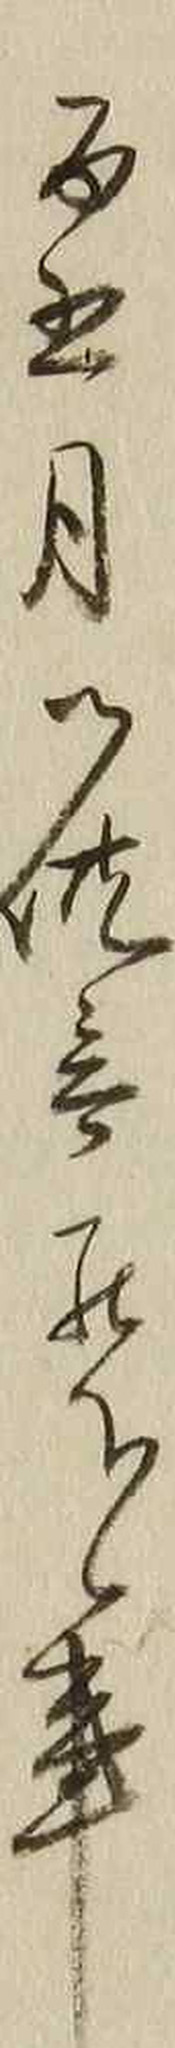酉五月御供ニ而罷下候事
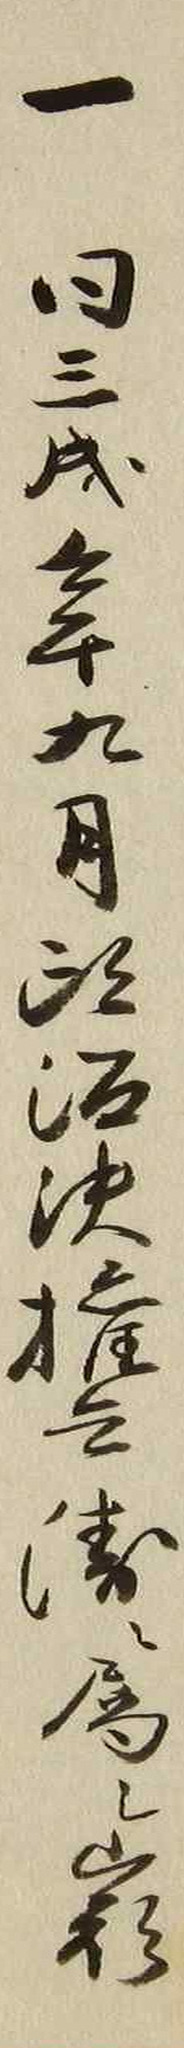一同三戌年九月頭沼沢権兵衛ニ属シ山形
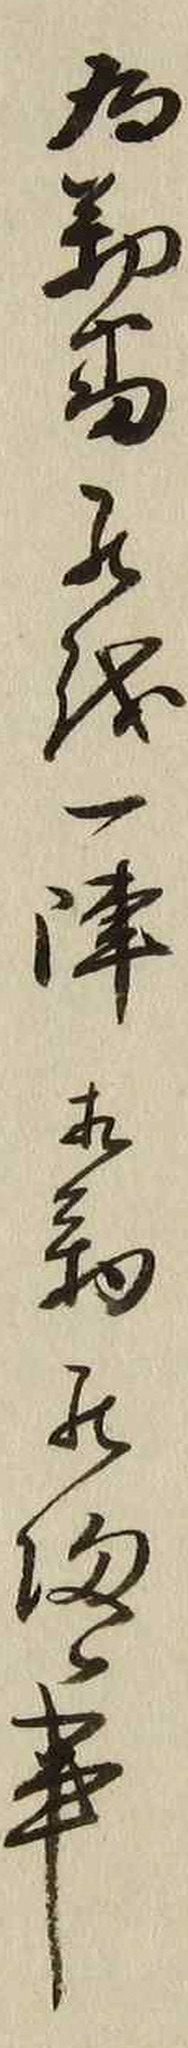為勤番罷越一陣相勤罷帰候事
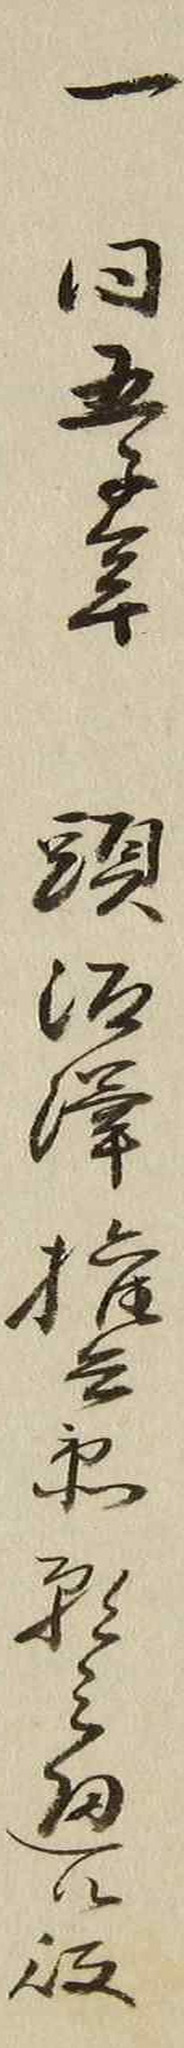一同五子年頭沼沢権兵衛願之通御役
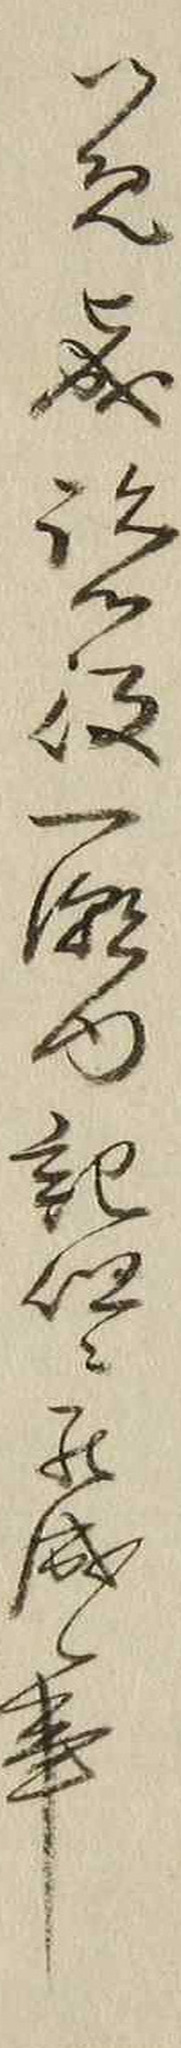御免被成跡御役一瀬内記組ニ罷成候事
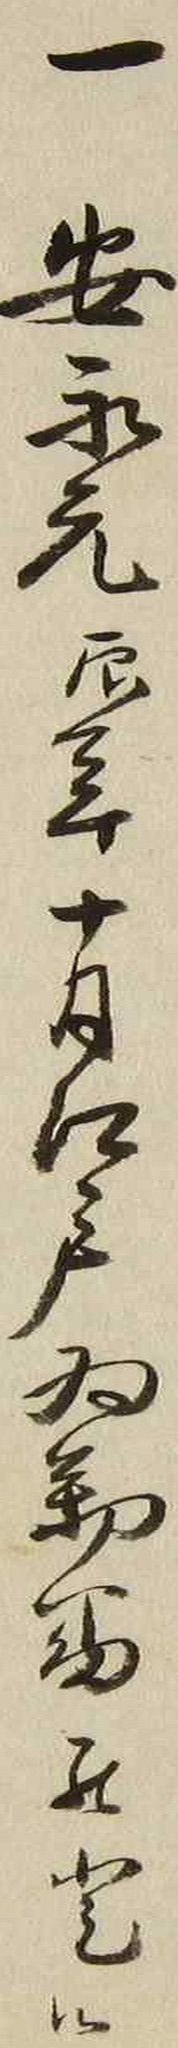一安永元辰年十月江戸為勤番罷登候
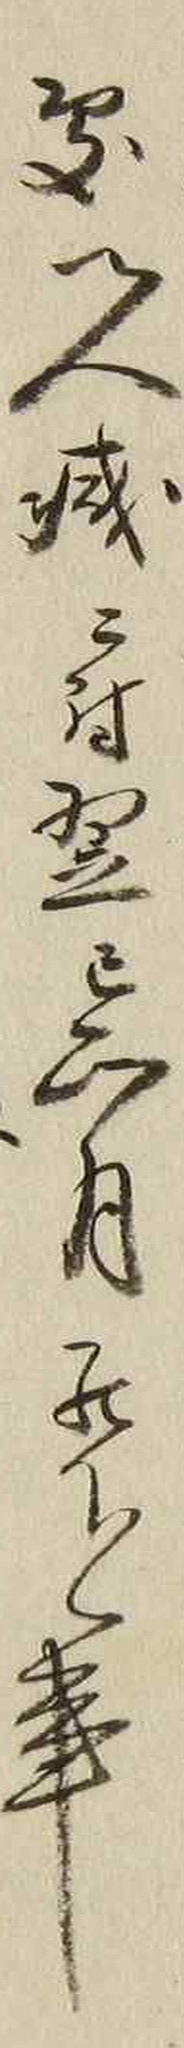処御人減ニ付翌巳六月罷下候事
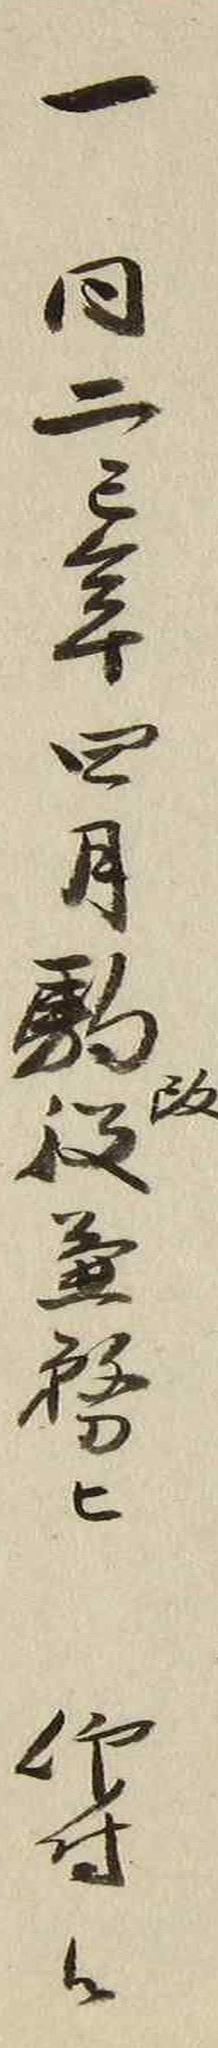一同二巳年四月駒改役兼務被仰付候
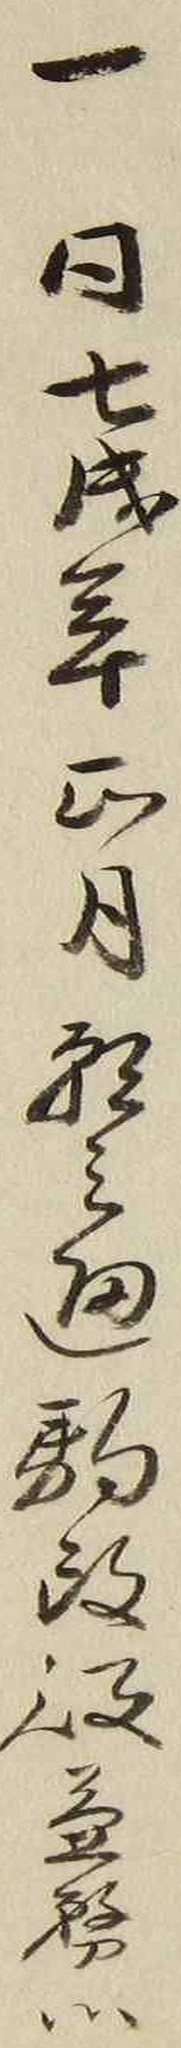一同七戌年正月願之通駒改役兼務御
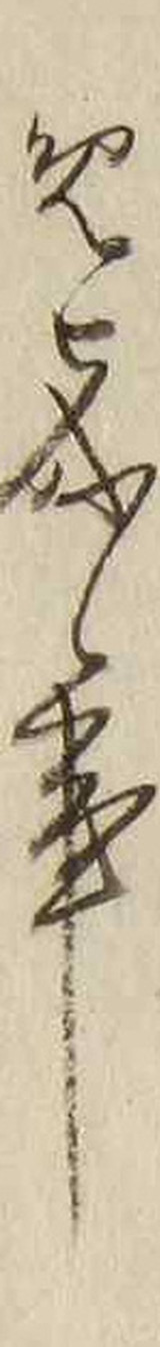免被成候事
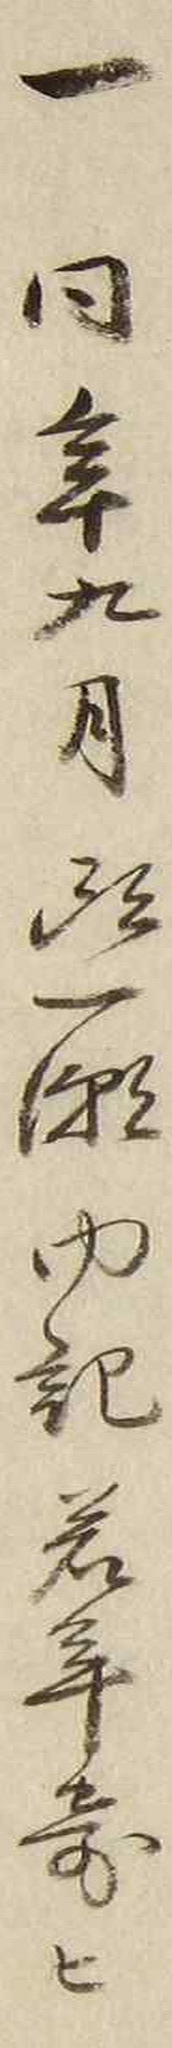一同年九月頭一瀬内記若年寄被

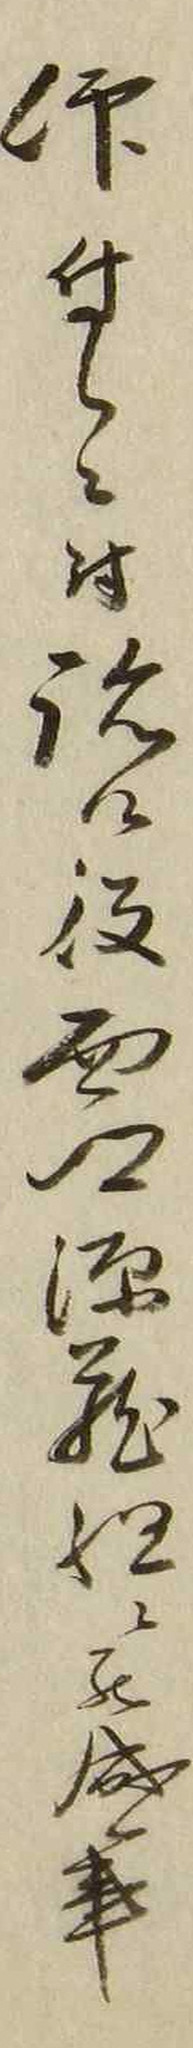仰付候ニ付跡御役西郷源蔵組ニ罷成候事
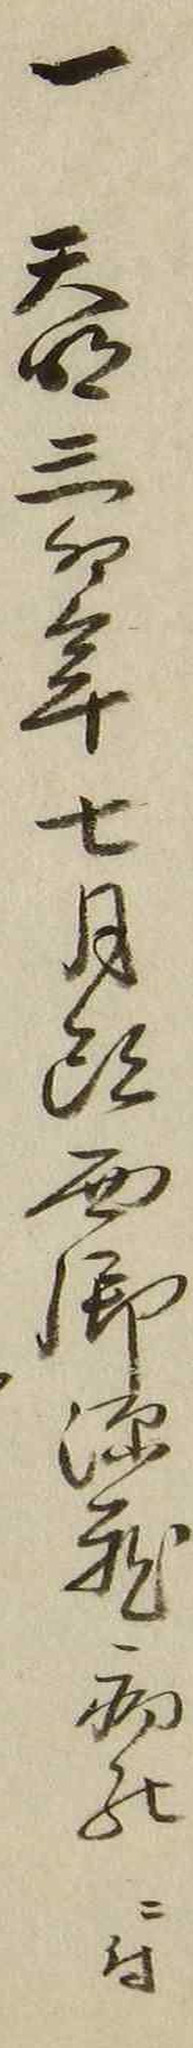一天明三卯年七月頭西郷源蔵病死ニ付
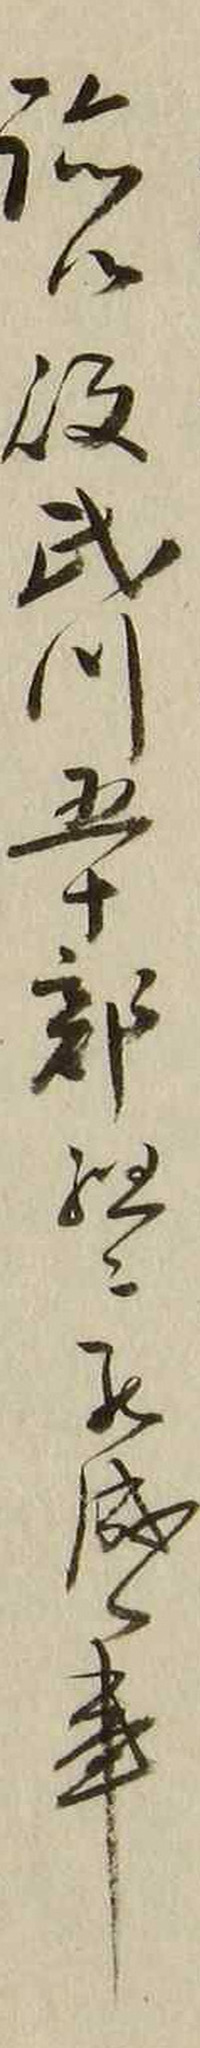跡御役武川五十郎組ニ罷成候事
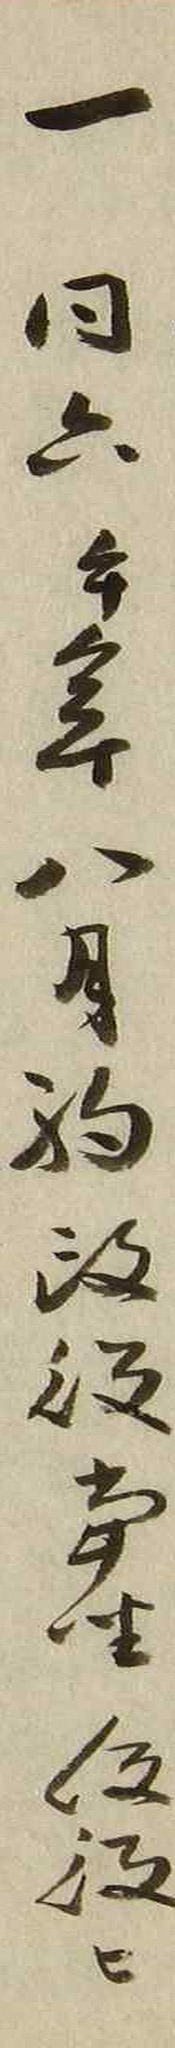一同六午年八月駒改役当座仮役被
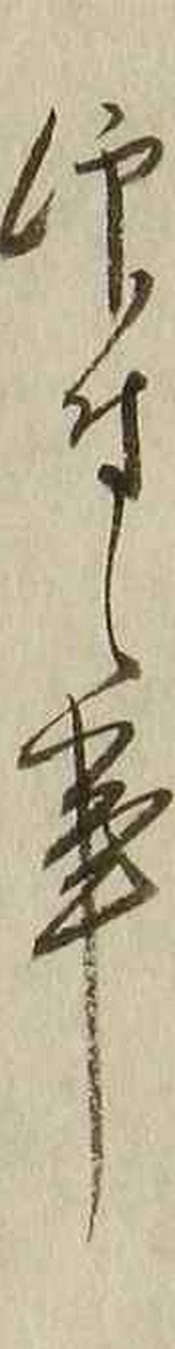仰付候事
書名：諸士系譜　巻之311　し之部1
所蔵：会津若松市立会津図書館
